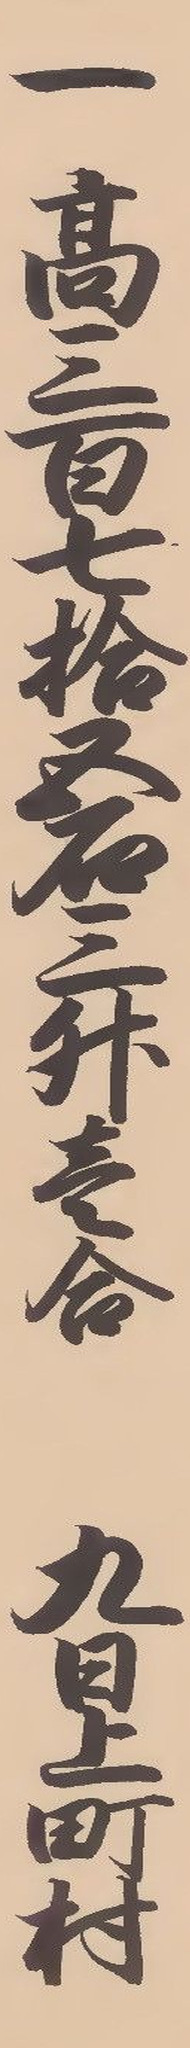一高三百七拾五石三斗壱合九日上町村
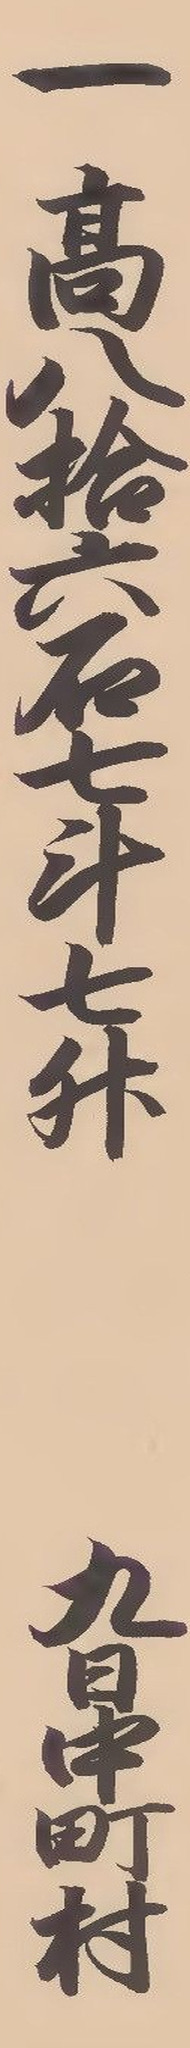一高八拾六石七斗七升九日中町村

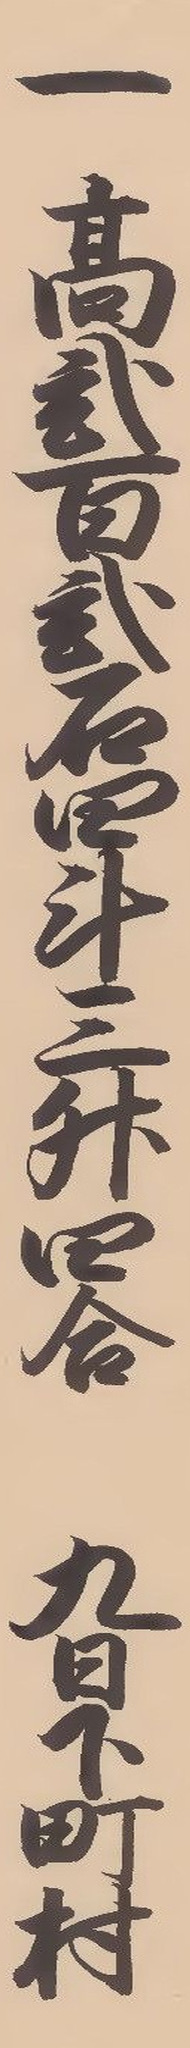一高弐百弐石四斗三升四合九日下町村
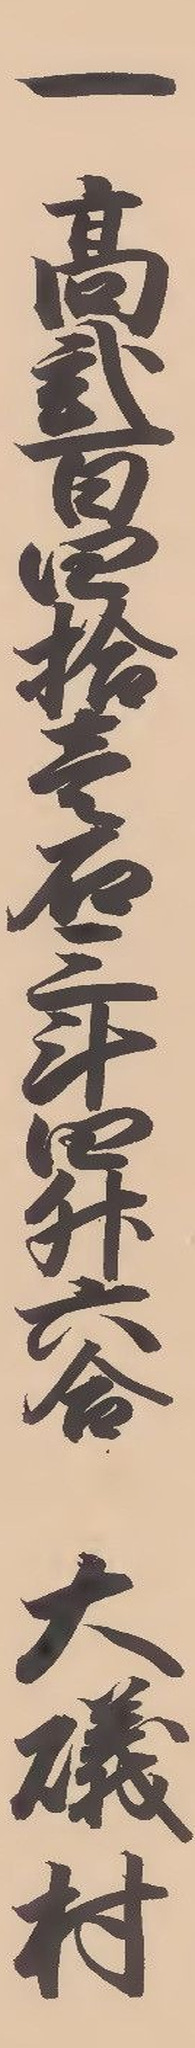一高弐百四拾壱石三斗四升六合大磯村
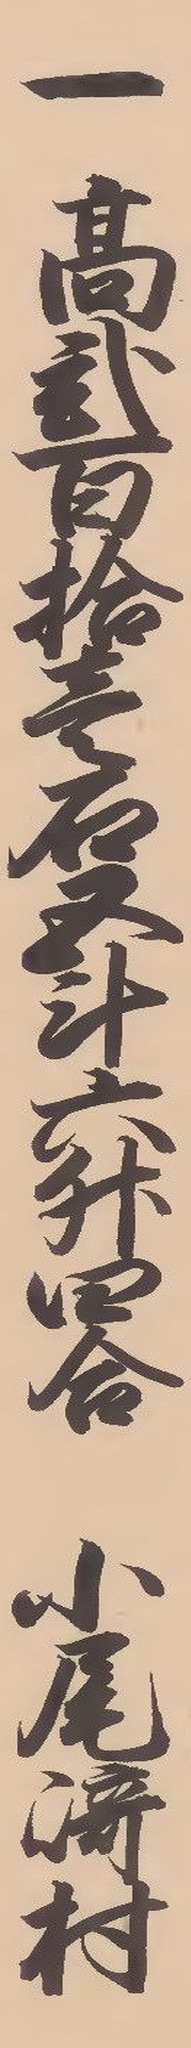一高弐百拾壱石五斗六升四合小尾崎村
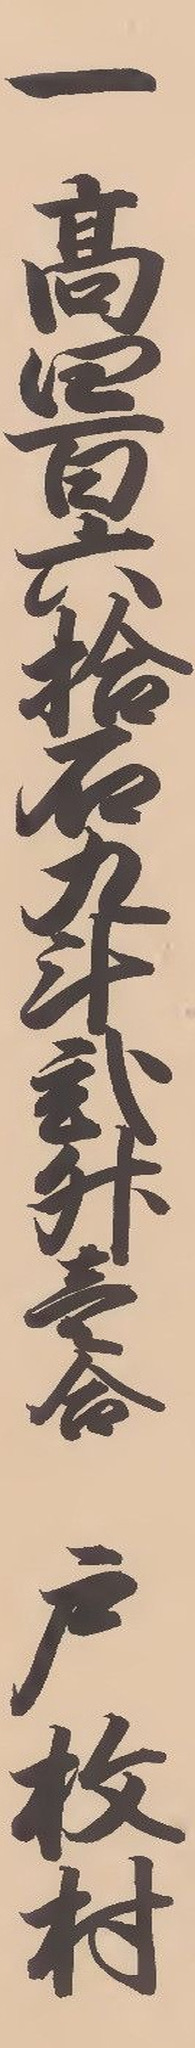一高四百六拾石九斗弐升壱合戸牧村
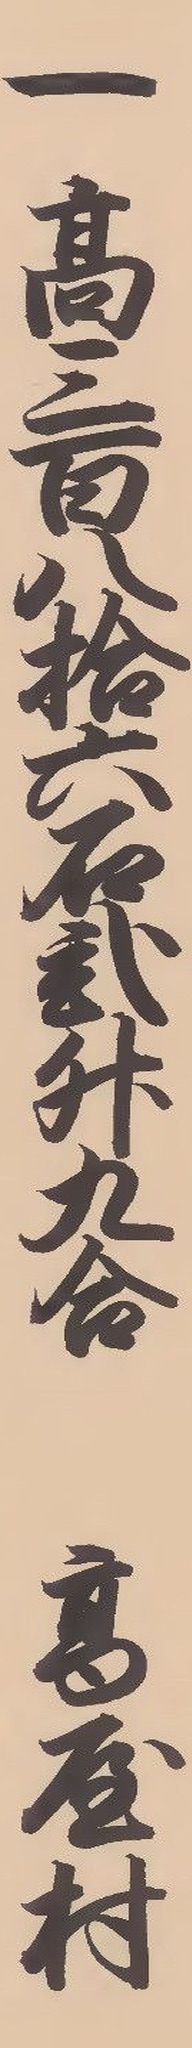一高三百八拾六石弐升九合高屋村
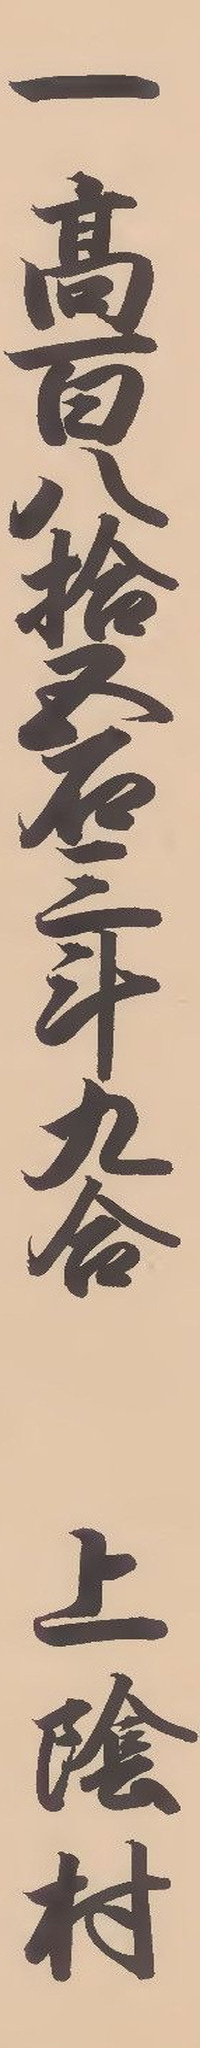一高百八拾五石三斗九合上陰村
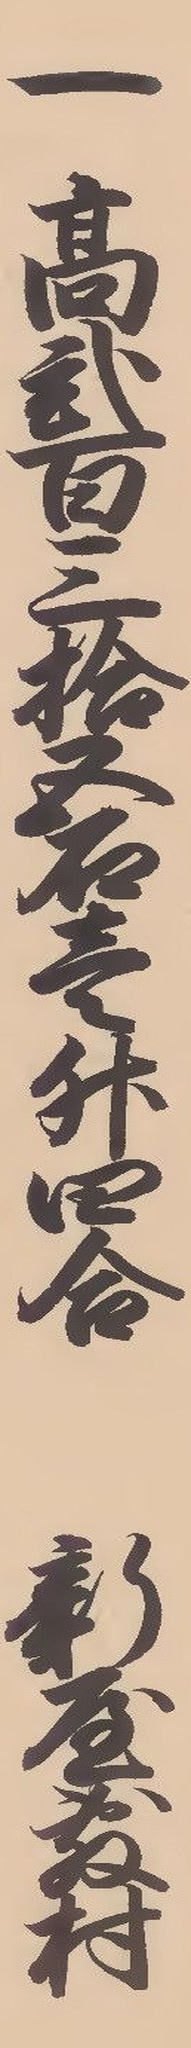一高弐百三拾五石壱斗四合新屋敷村

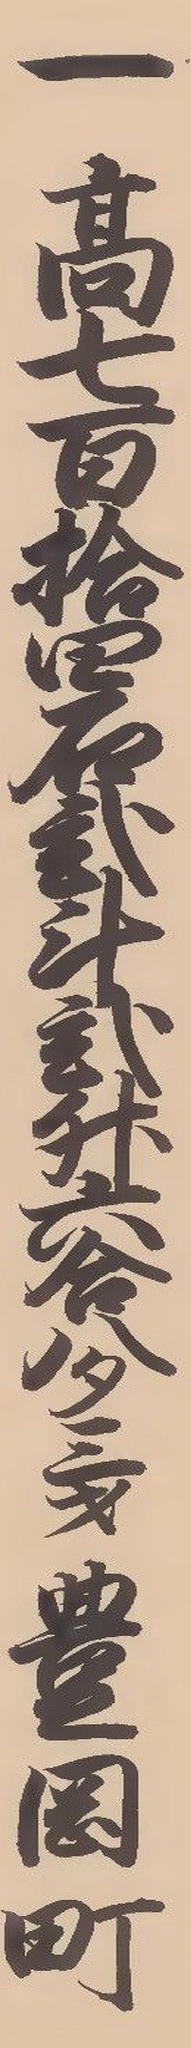一高七百拾四石弐斗弐升六合八勺三才豊岡村
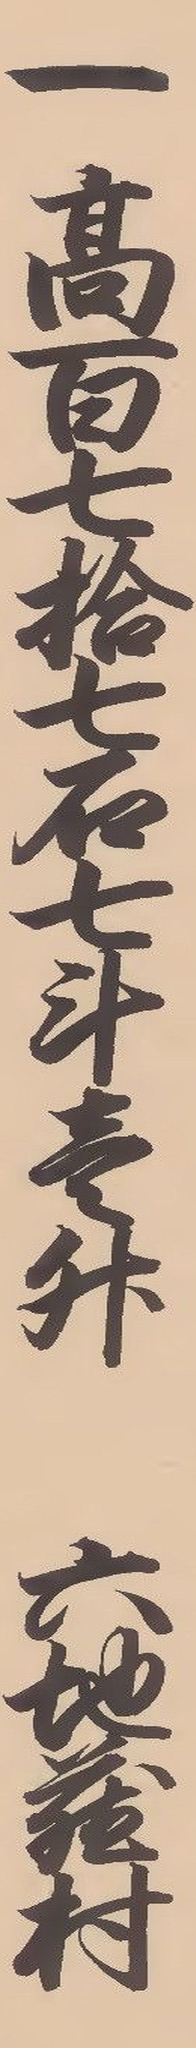一高百七拾七石七斗壱升六地蔵村
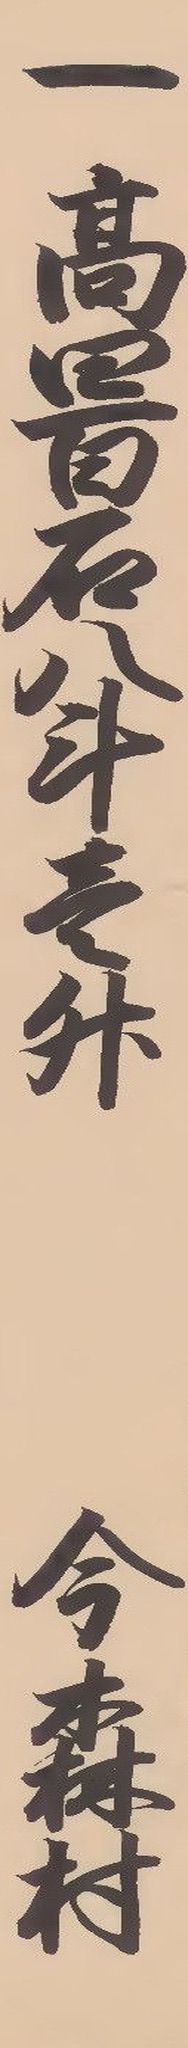一高四百石八斗壱升今森村
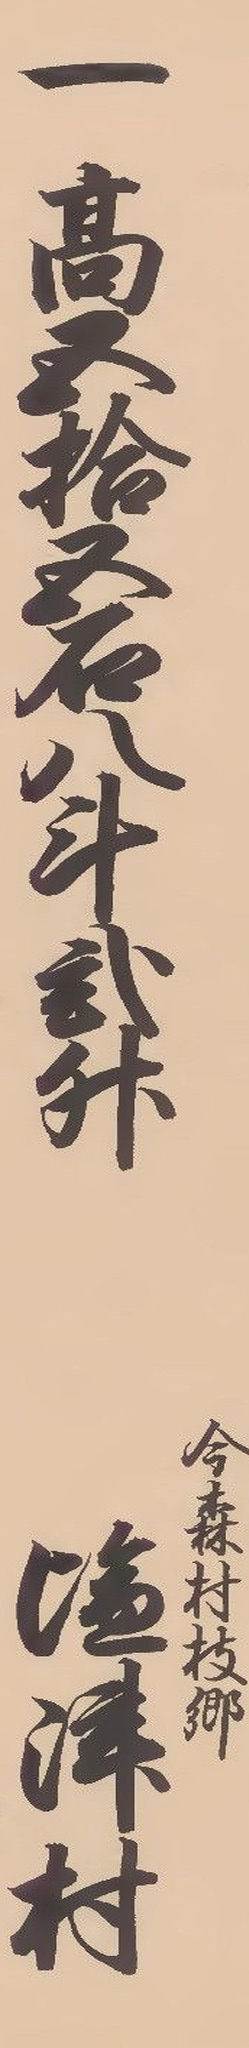一高五拾五石八斗弐升塩津村
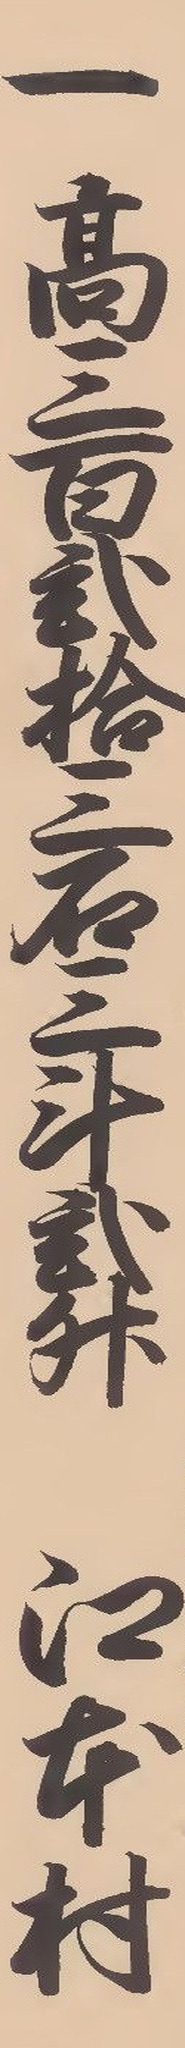一高三百弐拾三石三斗弐升江本村
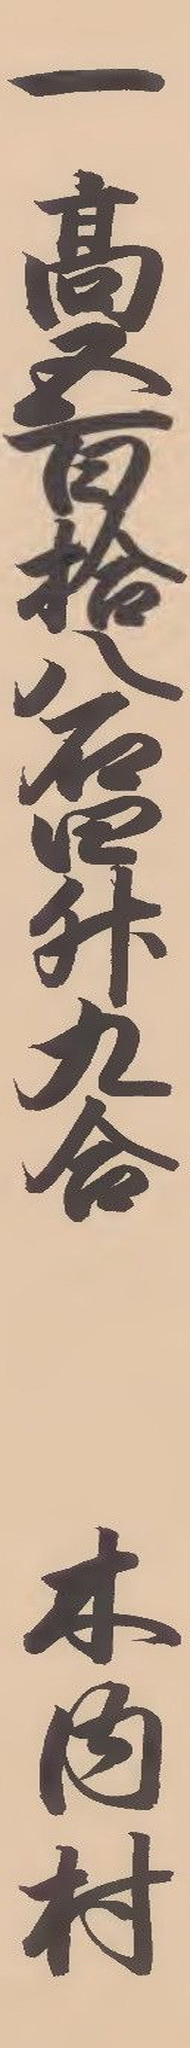一高五百拾八石四升九合木内村
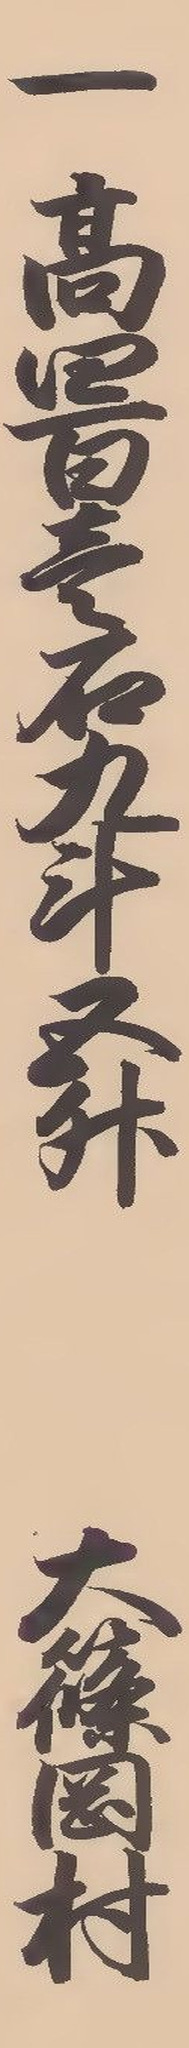一高四百壱石九斗五升大篠岡村
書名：但馬国郷帳
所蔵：国立公文書館 National Archives of Japan
